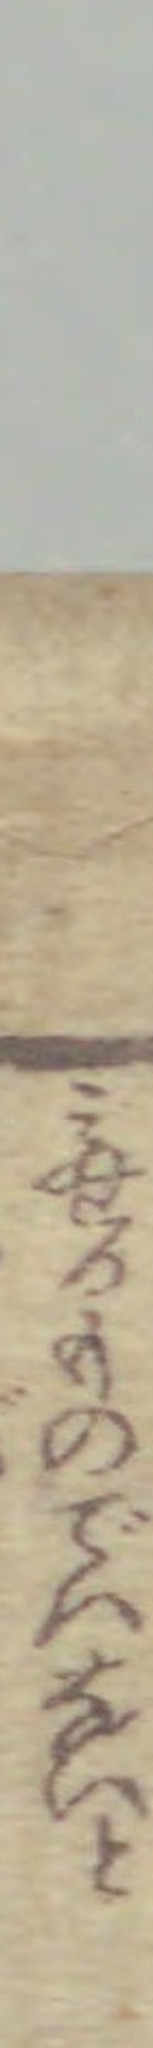みせるものではないと

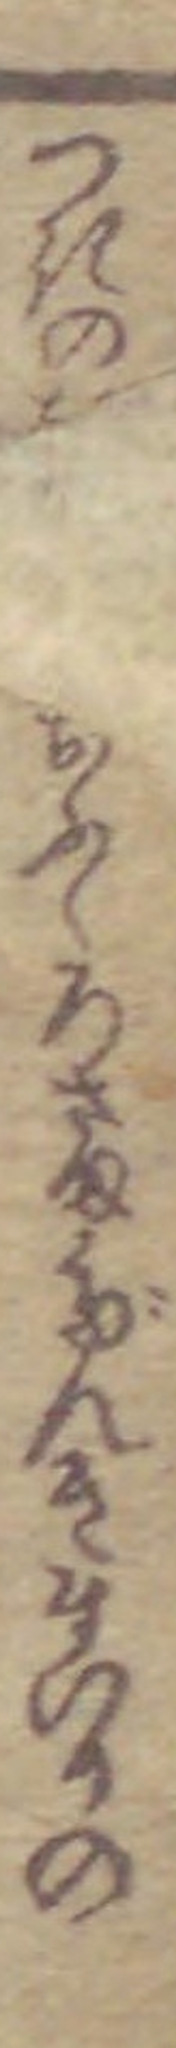つきのおふくろさまだんきまいりの
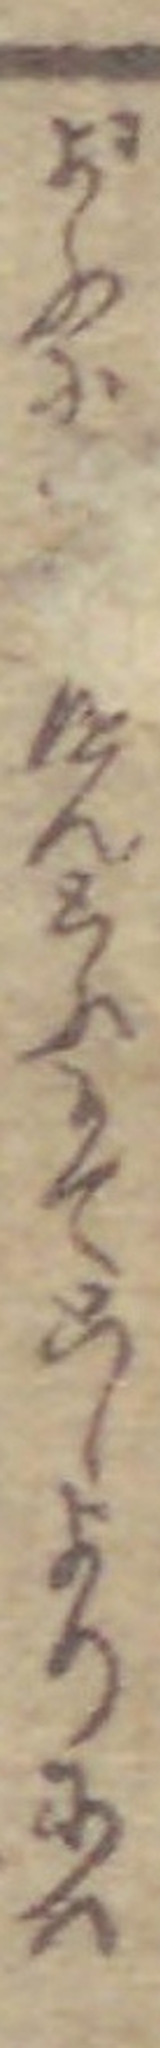よふにんとふにてとしよりには
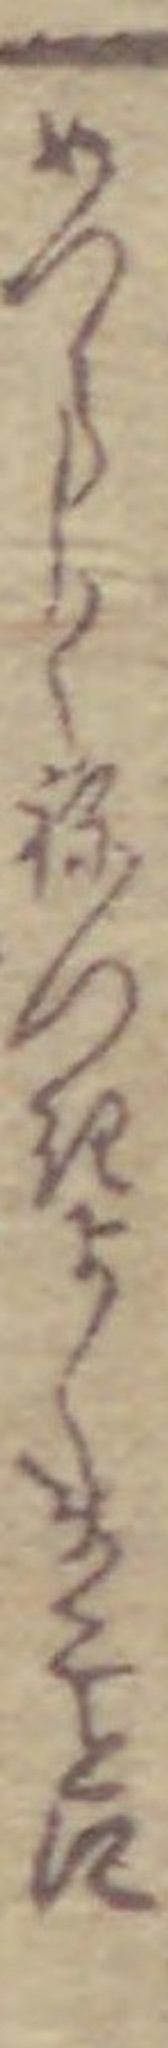めつらしくねつきよくまことに
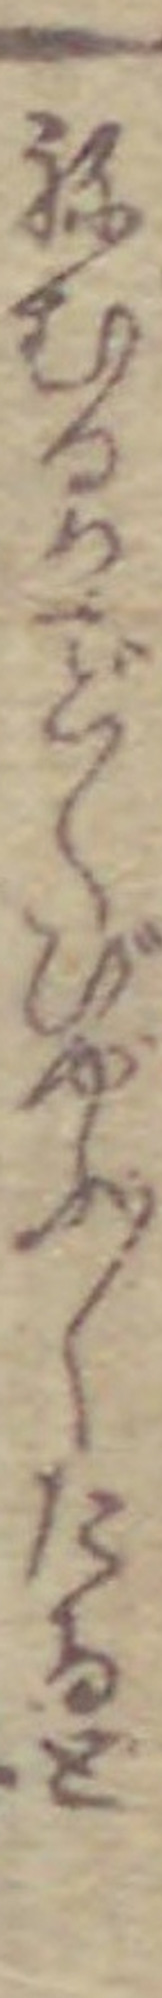ねむるかごとくびやふ〳〵たると
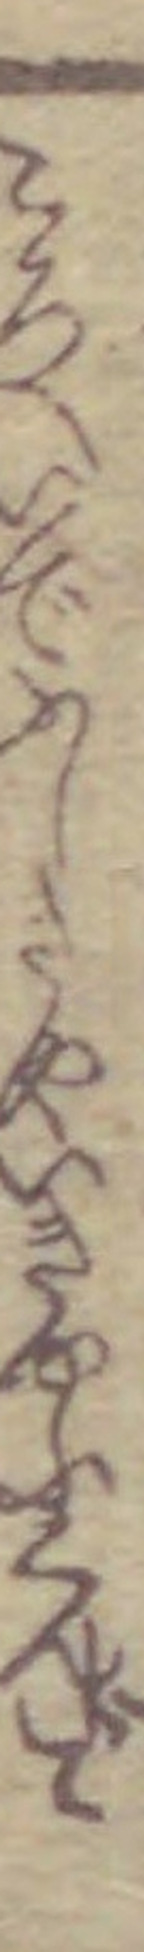ころへいでふしきやいきやふくんじて
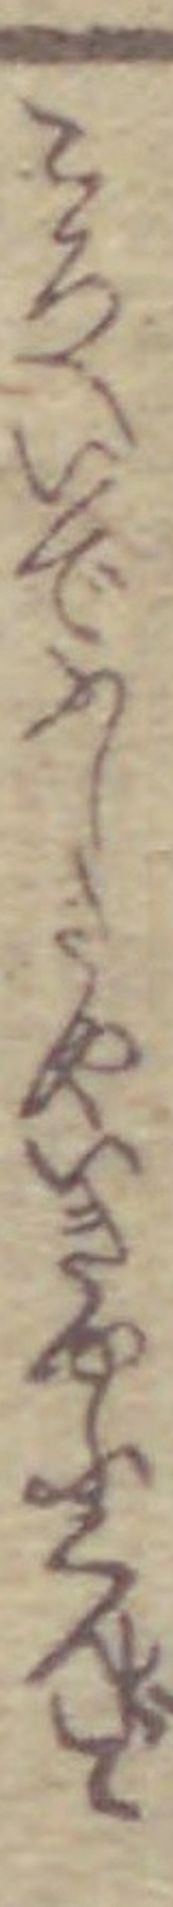ころへいでふしきやいきやふくんじて
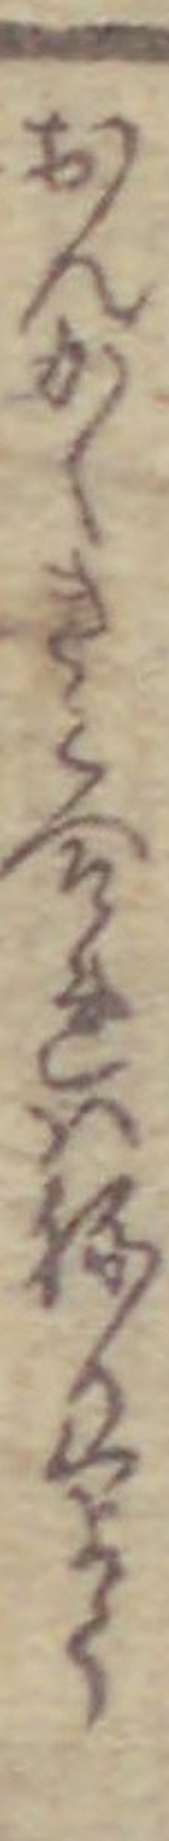おんかくきこへけれはねりくよう
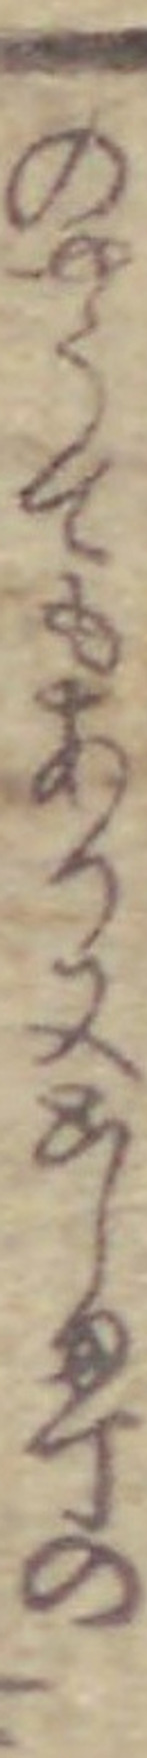のやうてもあり又としま丁の
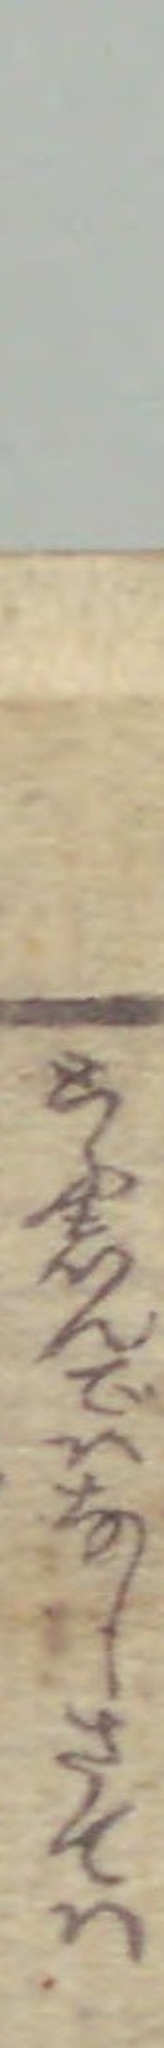とふしんではなしさては
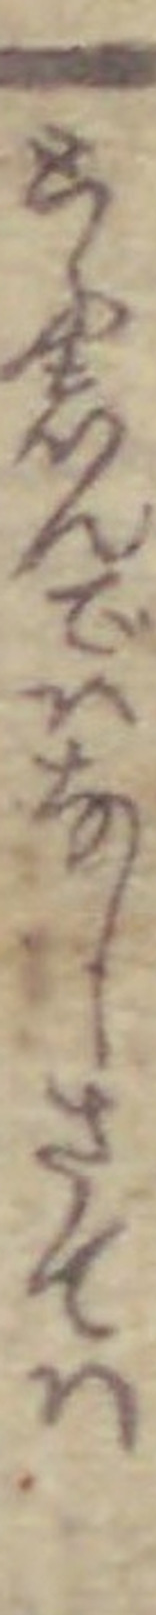とふしんではなしさては
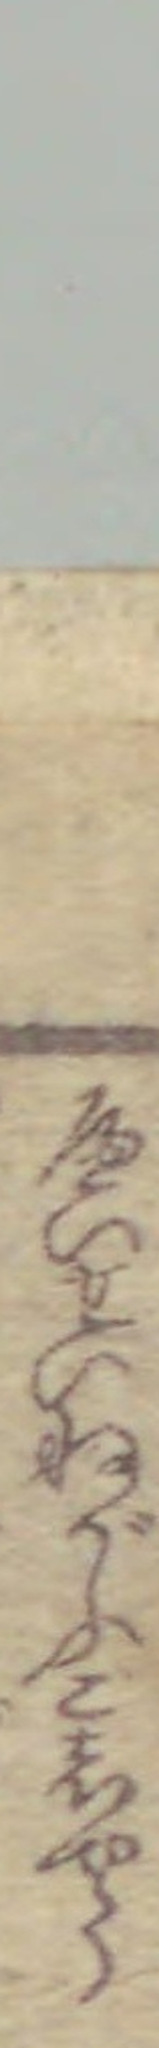へいせいねがふこしやう
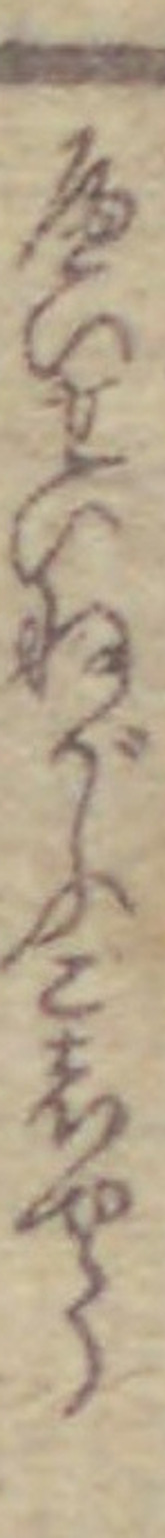へいせいねがふこしやう
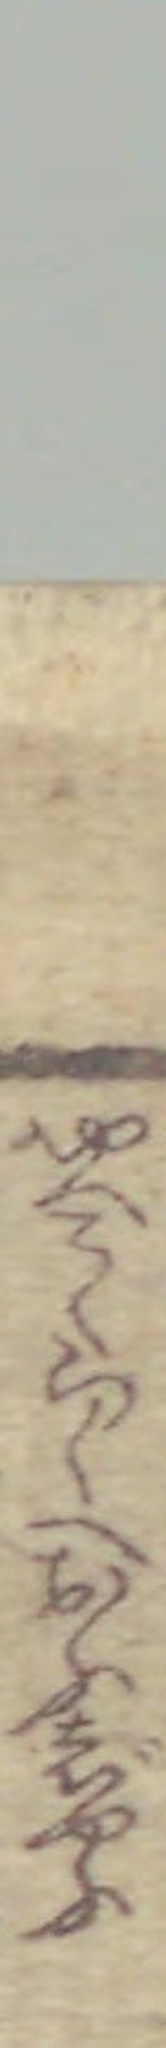ゆへこくらくへおふじやふ
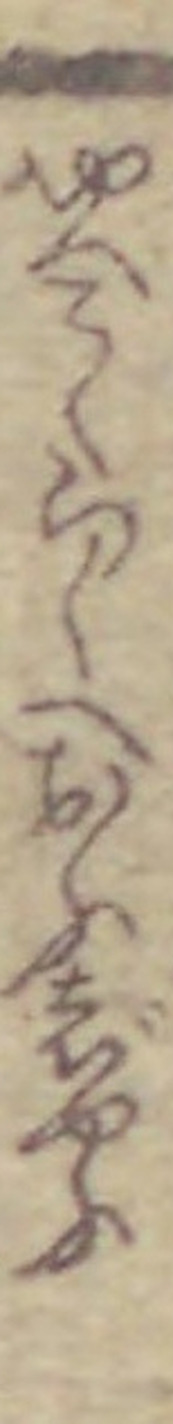ゆへこくらくへおふじやふ
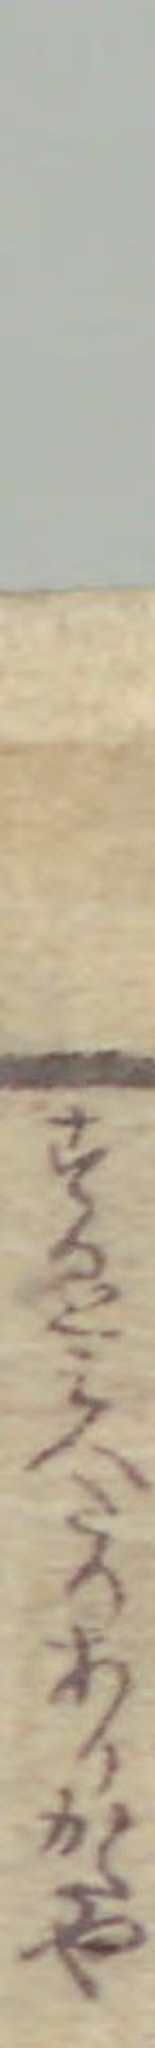するとみへたりありかたや
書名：思事夢濃枕 3巻
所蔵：国立国会図書館 National Diet Library, JAPAN
